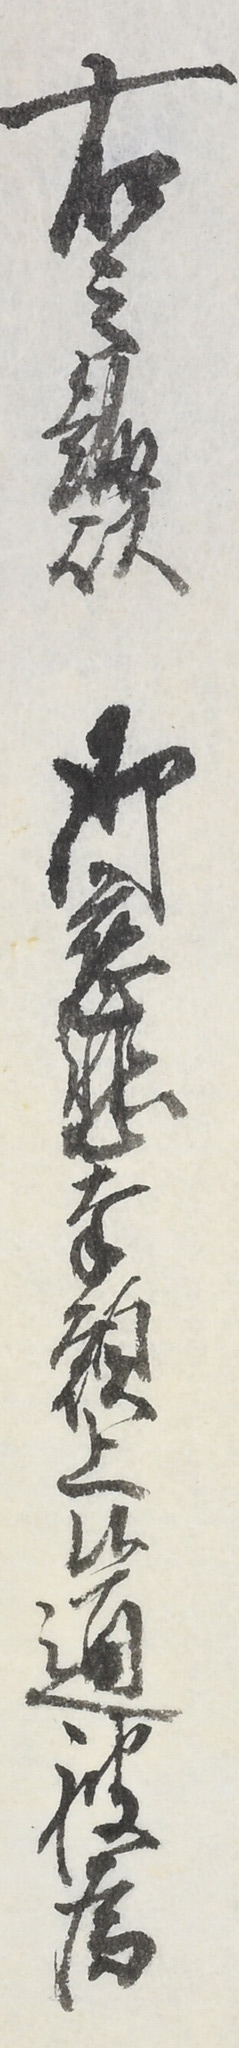右之趣以御慈悲奉願上候通被為
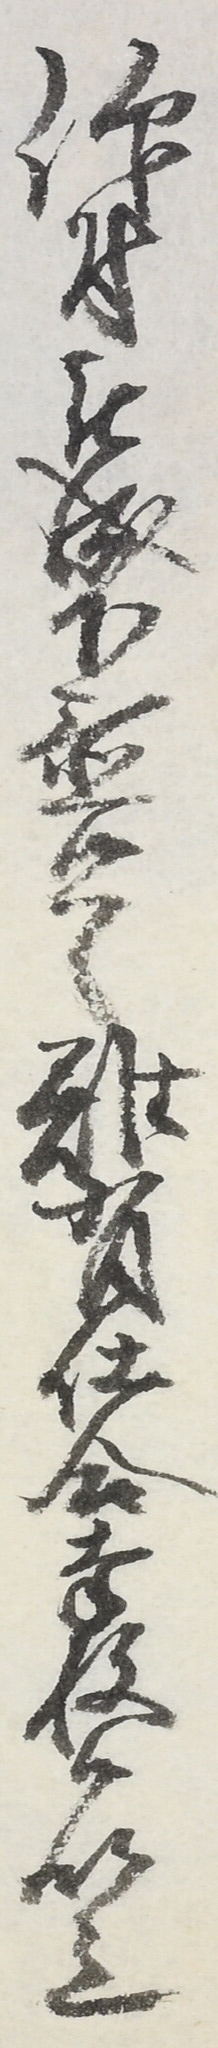仰付被成下置候ハゝ難有仕合奉存候以上

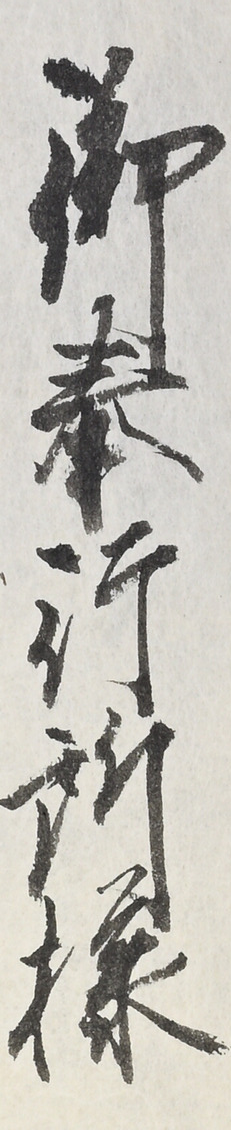御奉行所様
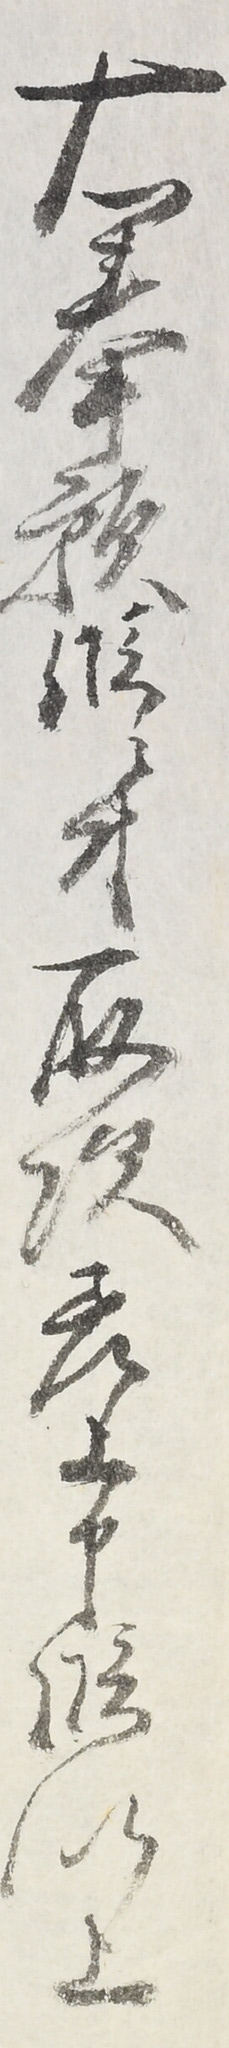右奉願候ニ付取次差上申候以上

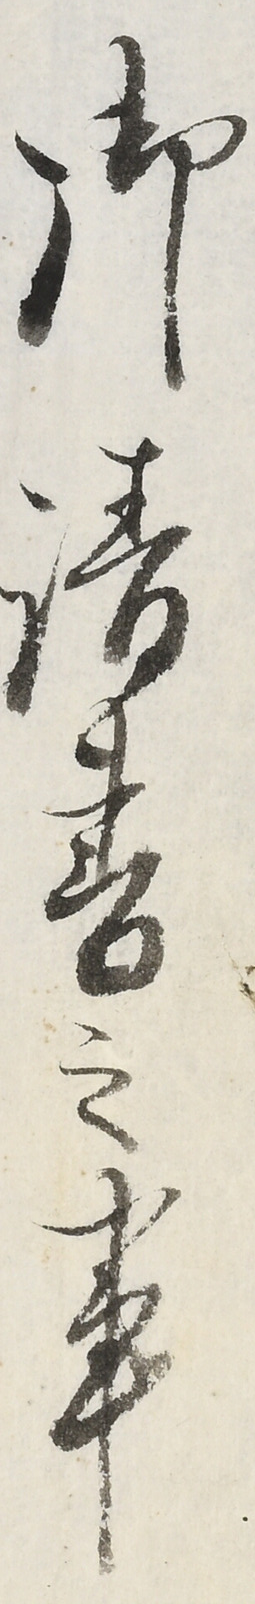御請書之事
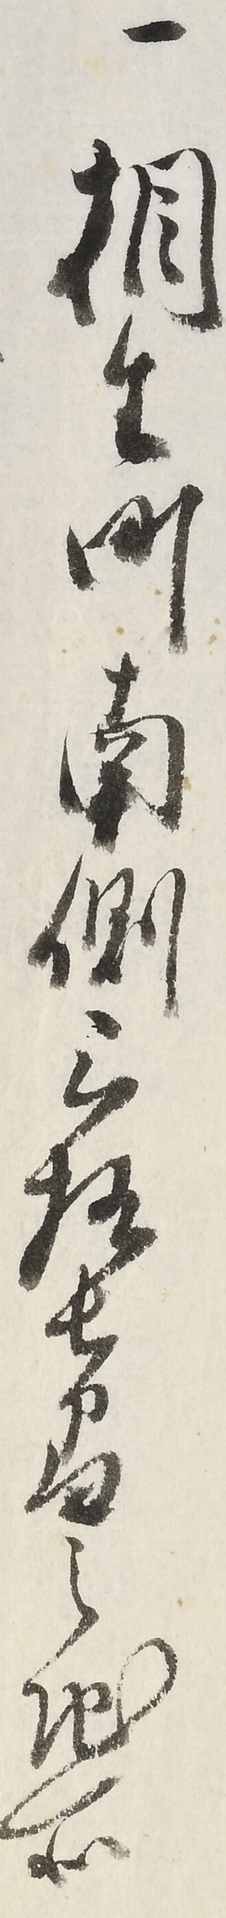一相生町南側三拾七間之地所
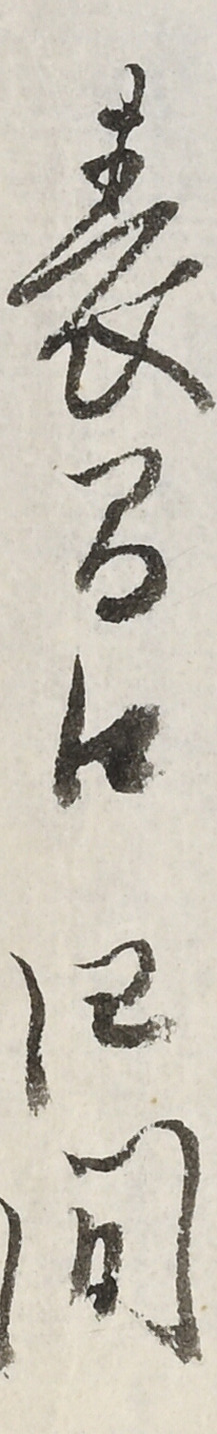表間口四間
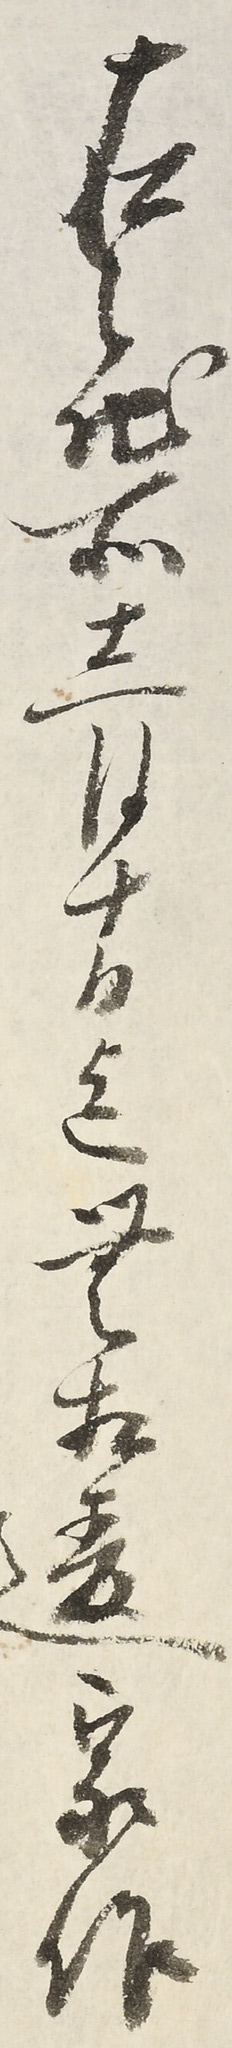右之地所十二月十日迄無相違家作
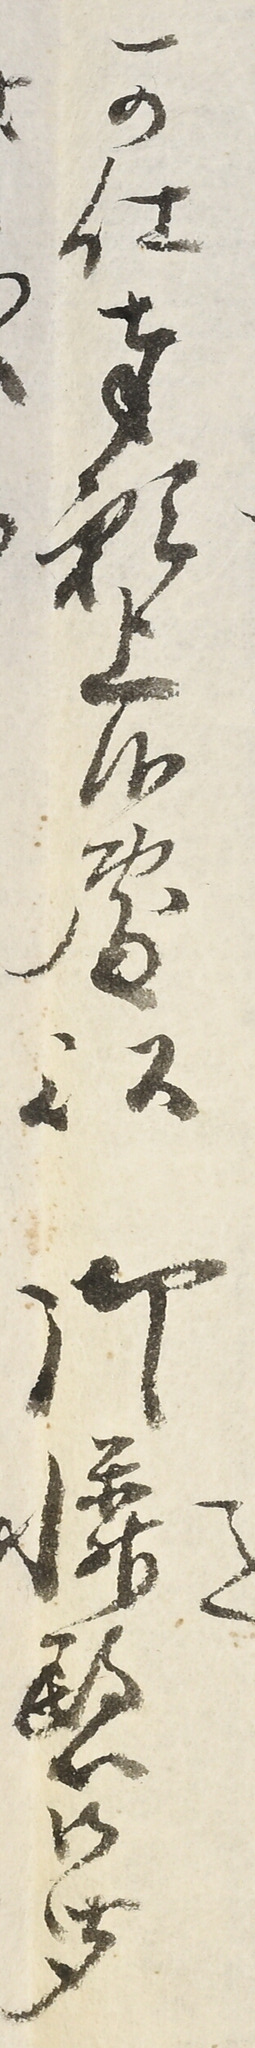可仕奉願上候処以御憐愍御聞
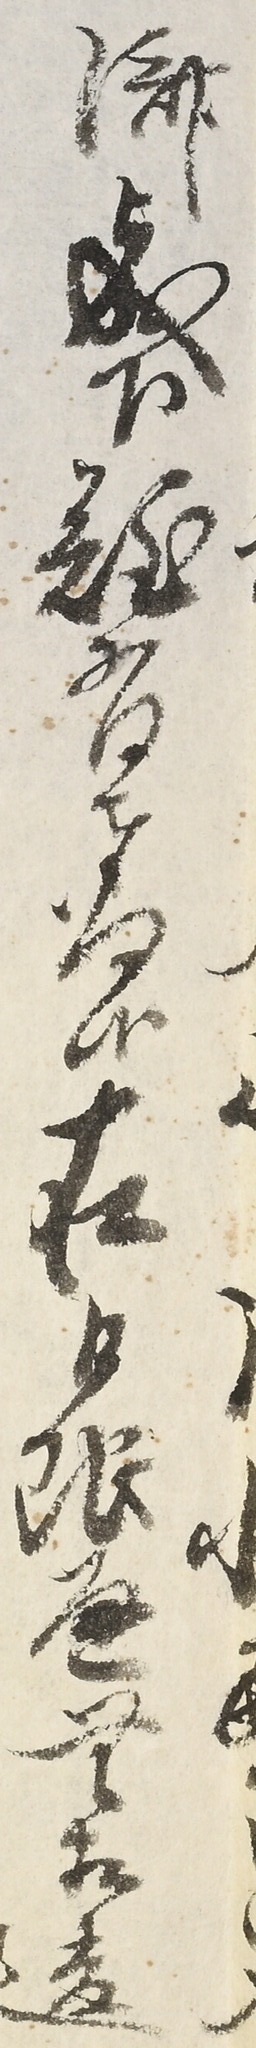済被成下難有奉存候右日限通無相違
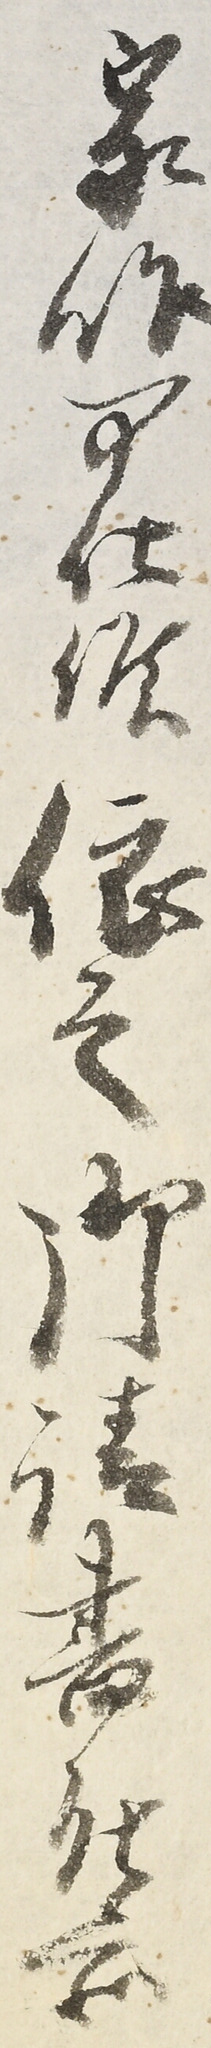家作可仕候依之御請書仕候所
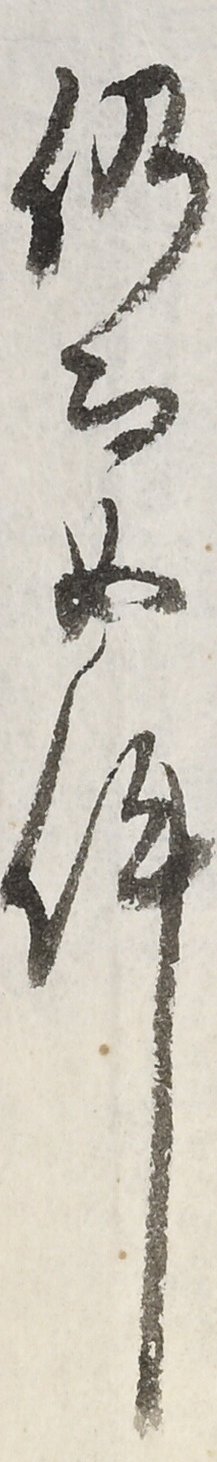仍而如件
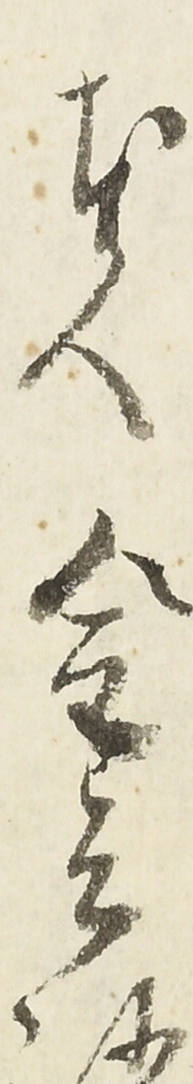本人金兵衛㊞
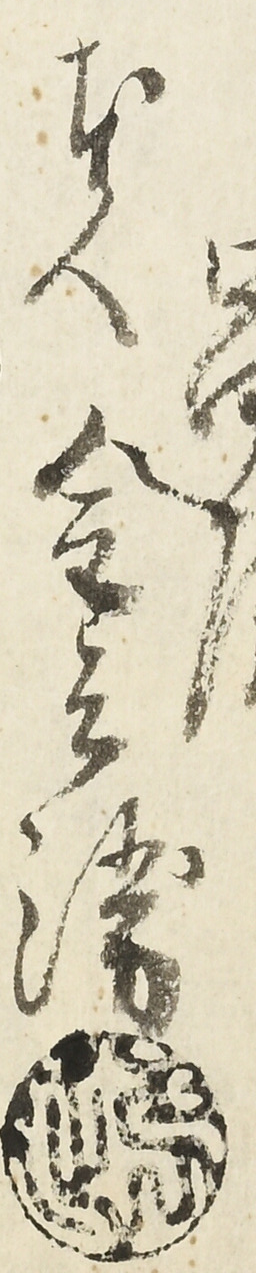本人金兵衛㊞
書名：乍恐以口上書奉嘆願候
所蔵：伊那市立高遠町図書館・合同会社AMANE
